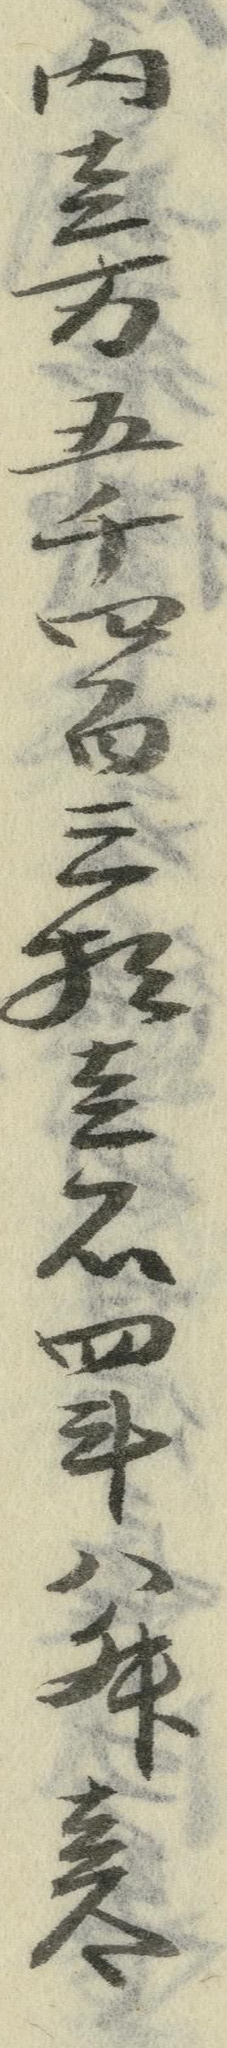内壱万五千四百三拾壱石四斗八升壱合
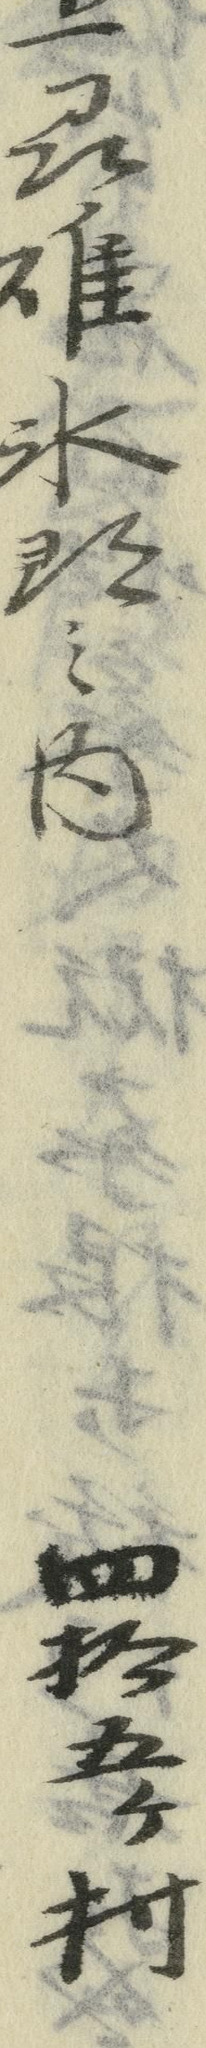上州碓氷郡之内四拾五ケ村
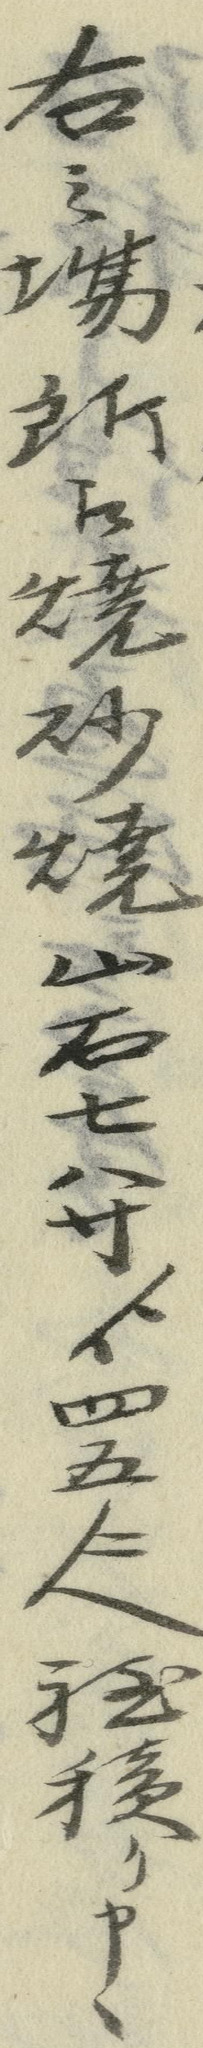右之場所江焼砂焼岩七八寸ゟ四五尺程積申候
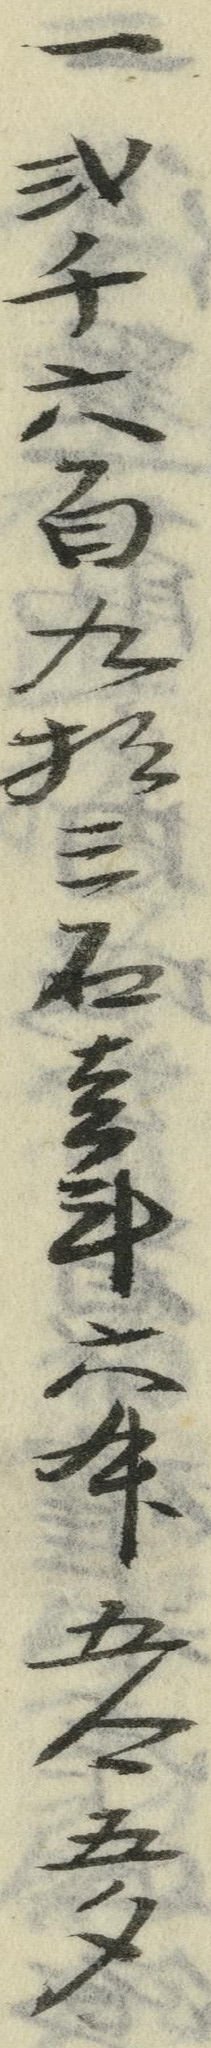一弐千六百九拾三石一斗六升五合五勺
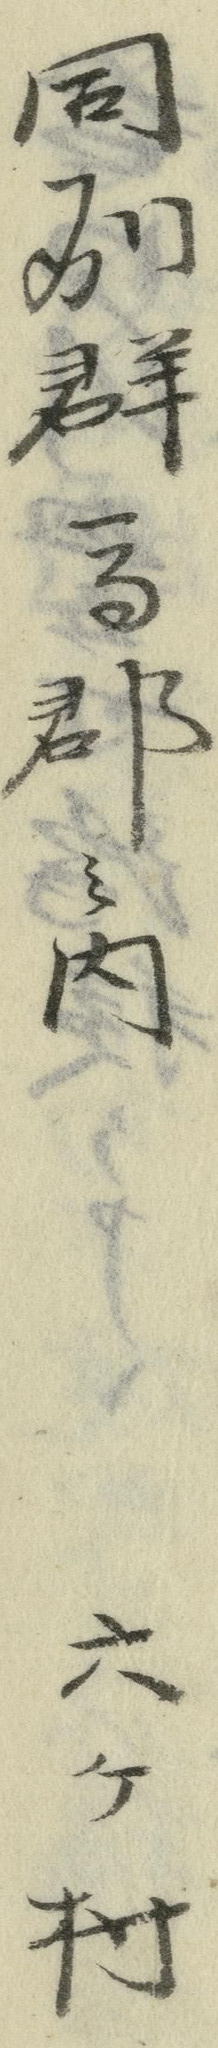同州群馬郡之内六ケ村

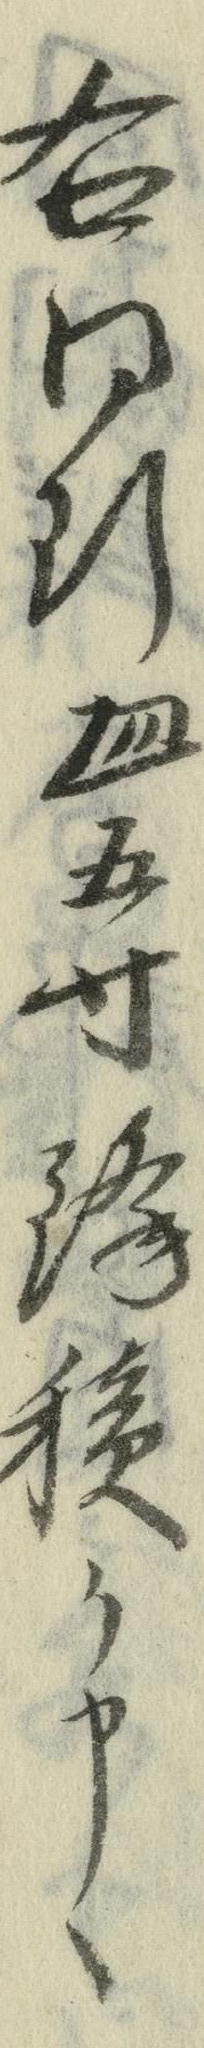右同断四五寸降積リ申候
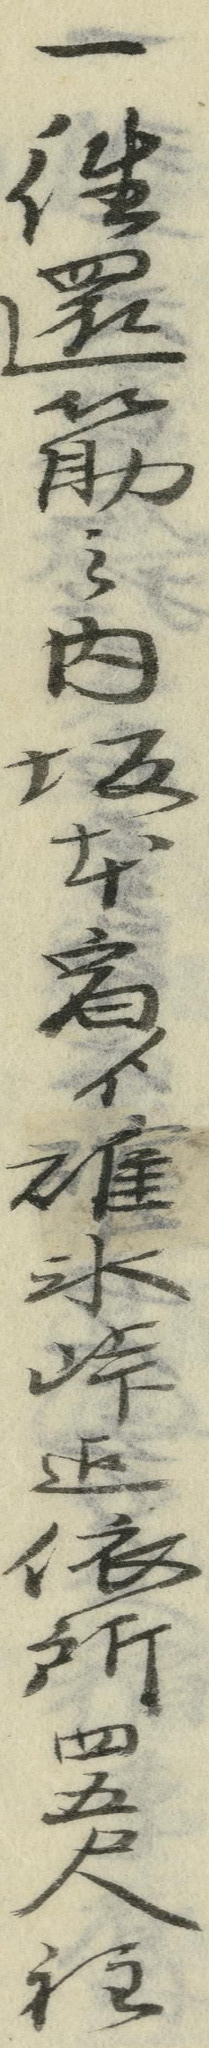一往還筋之内坂本宿ゟ碓氷峠迄依所四五尺程
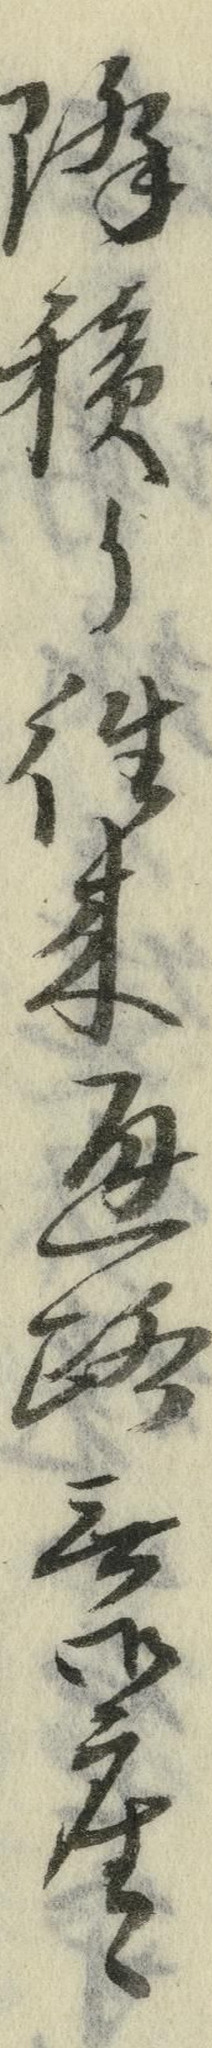降積リ往来通路無御座候
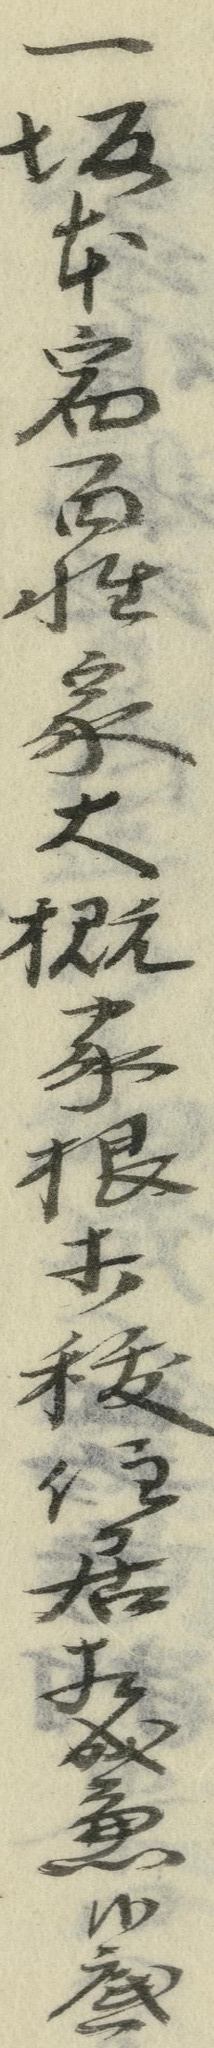一坂本宿百姓家大概家根打抜住居相成兼候底
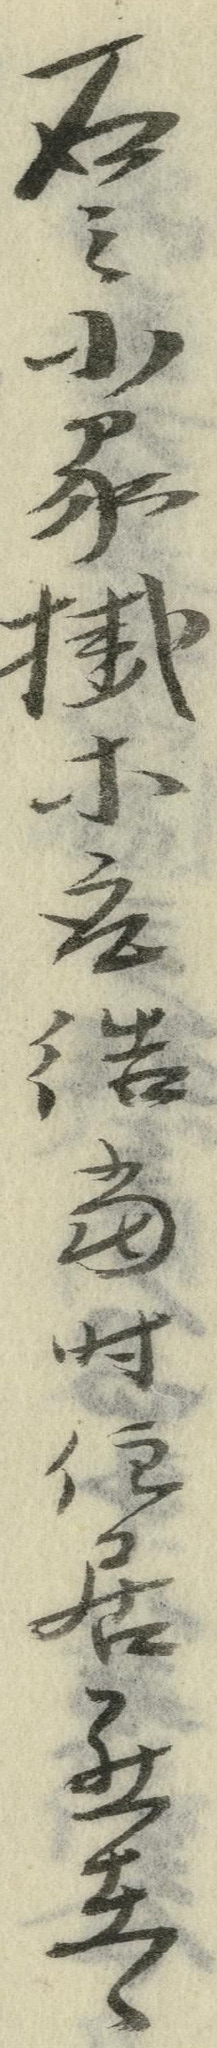石之小家掛等取結当時住居罷在候
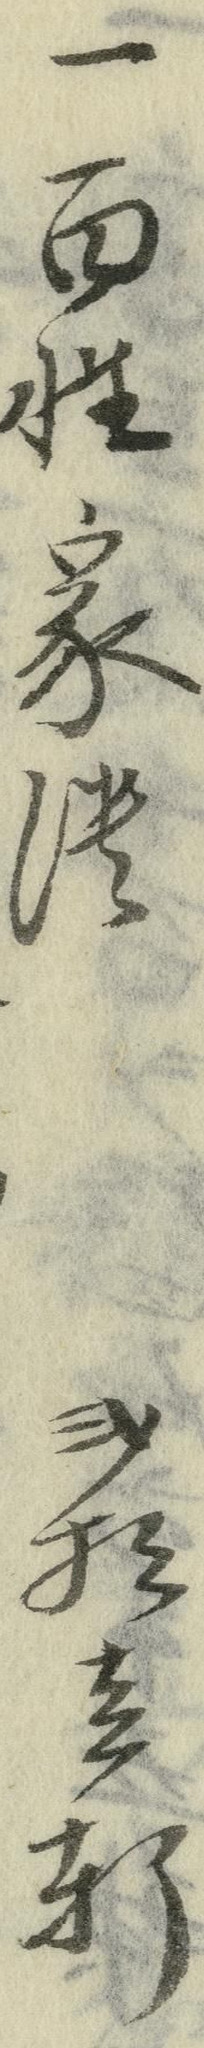一百姓家潰弐拾壱軒
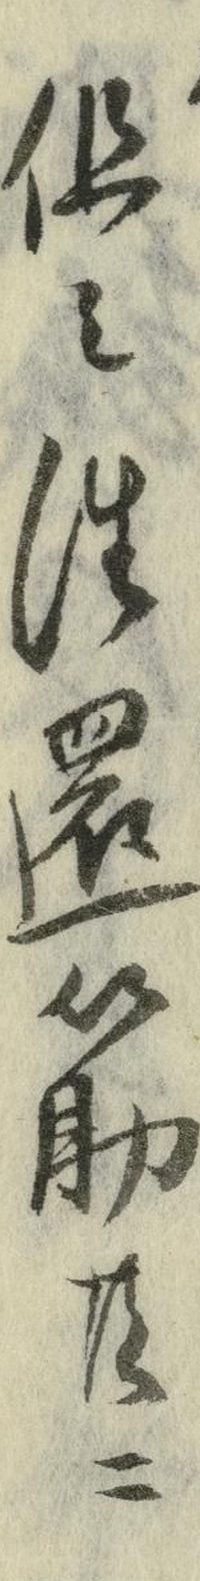但シ往還筋共ニ
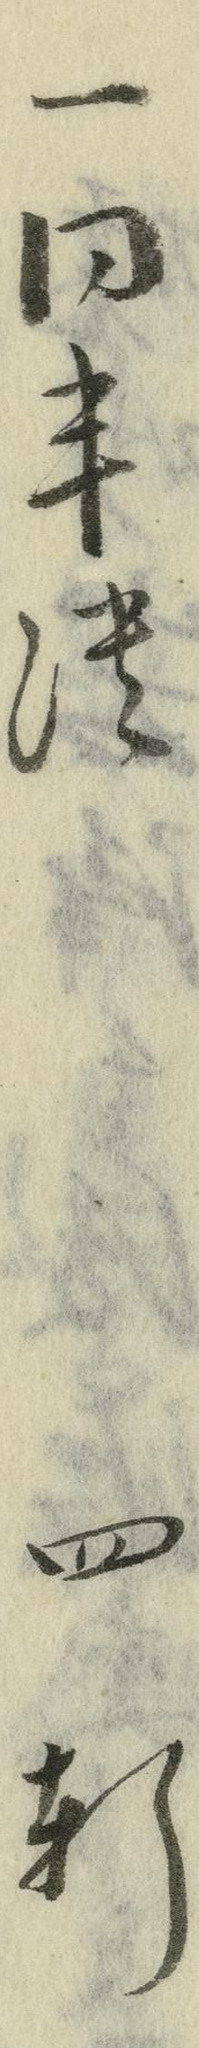一同半潰四軒
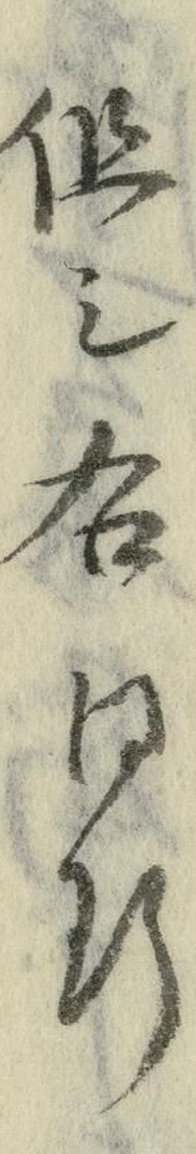但シ右同断
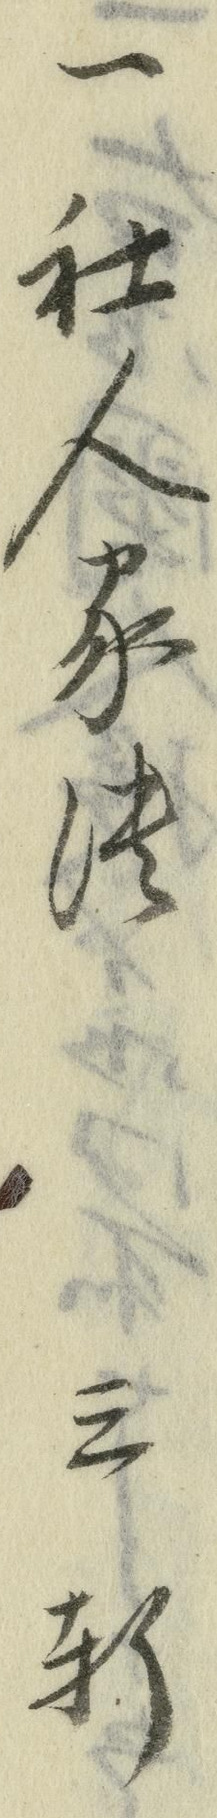一社人家潰三軒
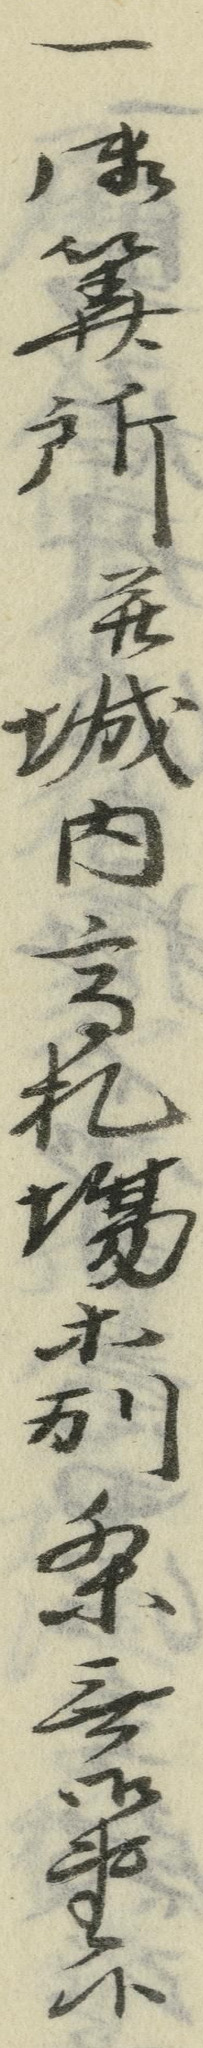一御算所幷城内高札場等別条無御座候
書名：天明三癸卯七月信州浅間山焼出シ上州山津浪ニ付近國ヨリ御届書并訴書写
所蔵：東京大学地震研究所図書室 Earthquake Research Institute Library, The University of Tokyo, JAPAN
